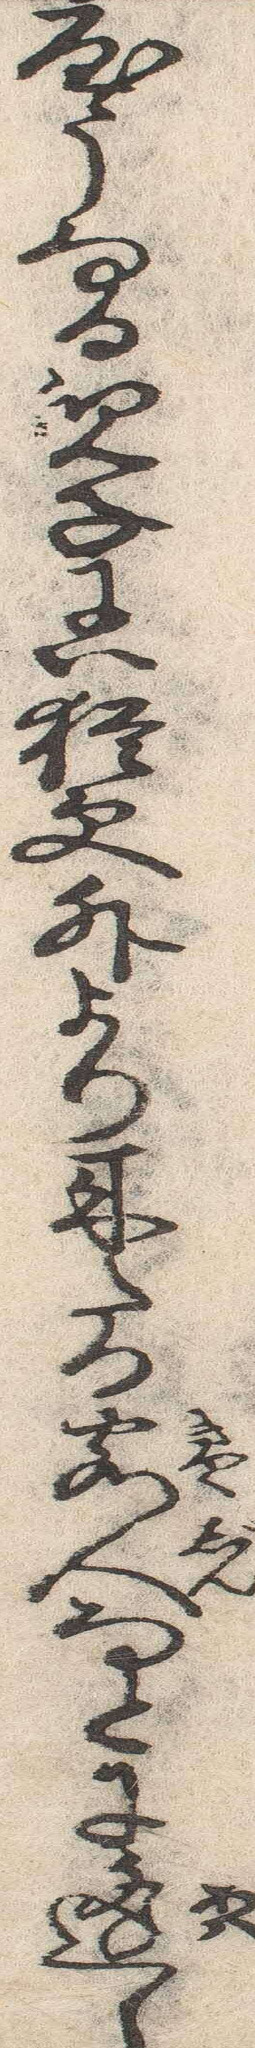やうなる児子には猶更外より来たる客人なとに逢し
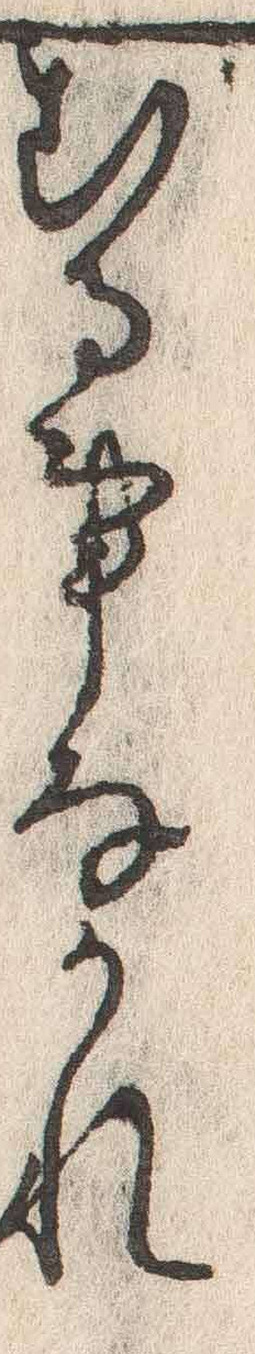むる事なかれ
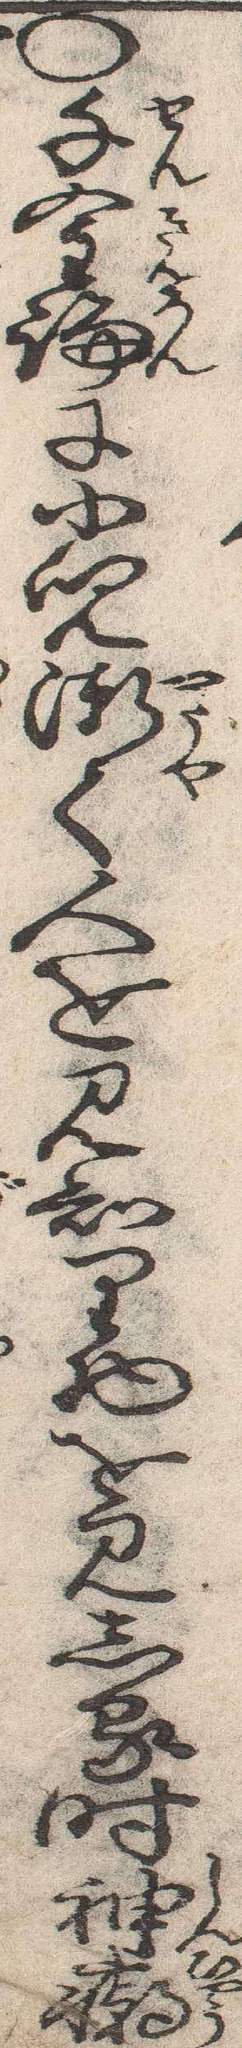○千金論に小児漸く人を見知り物を見しる时神
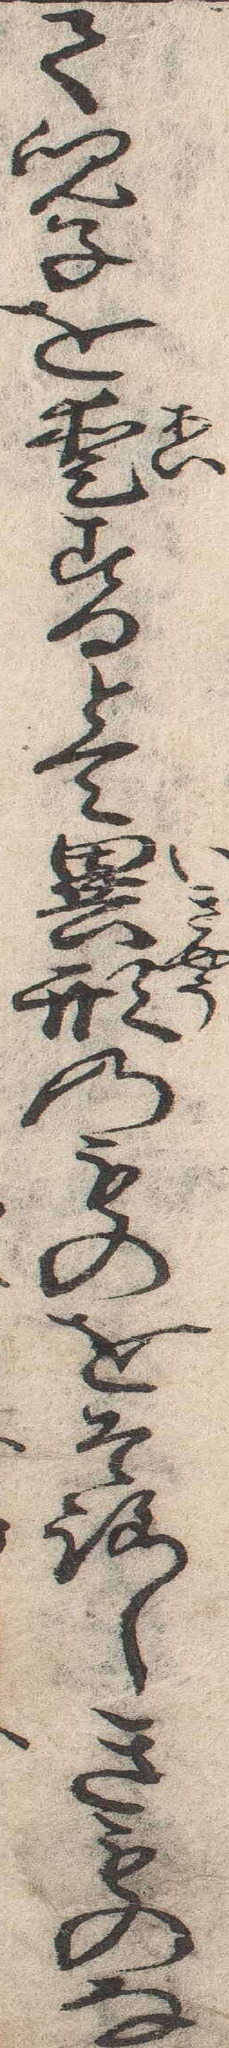て児子を愛するとて異形のものをそろしきものな
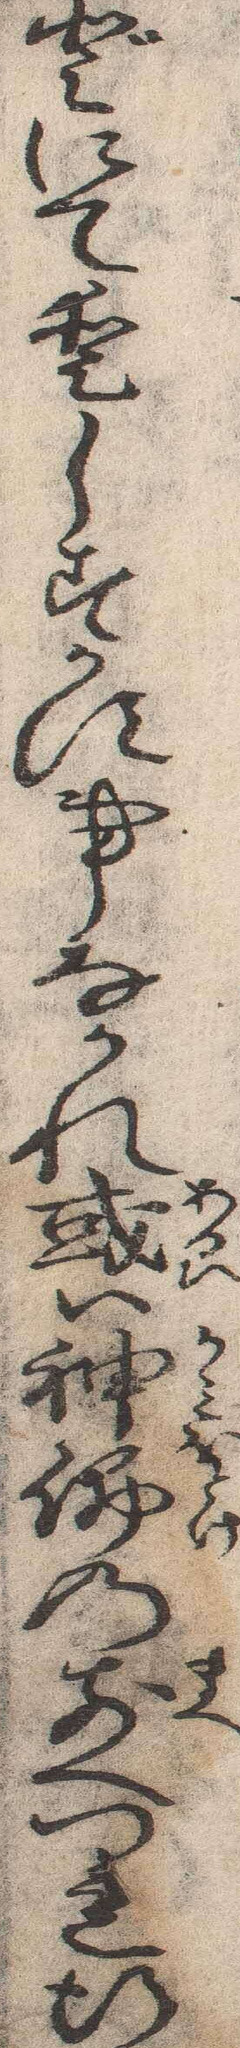どにて愛しすかす事なかれ或は神佛の前へつれ行

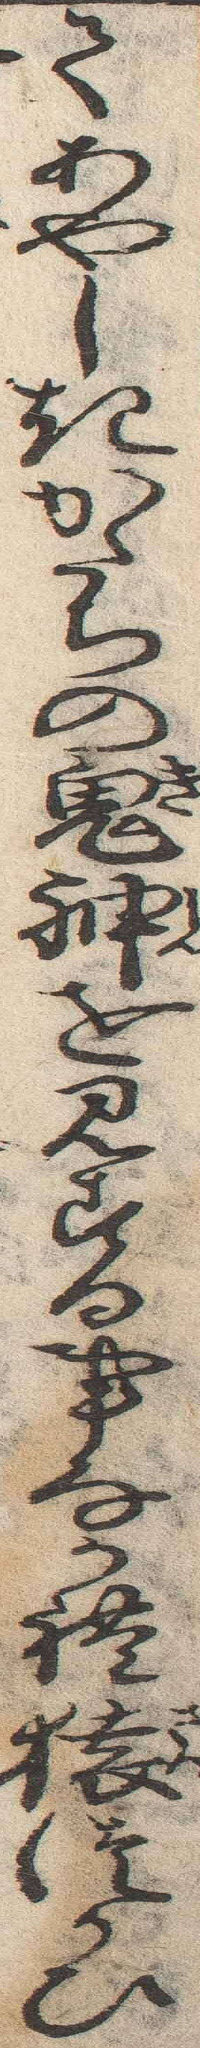てあやしきかたちの鬼神を見する事なかれ猿つかひ
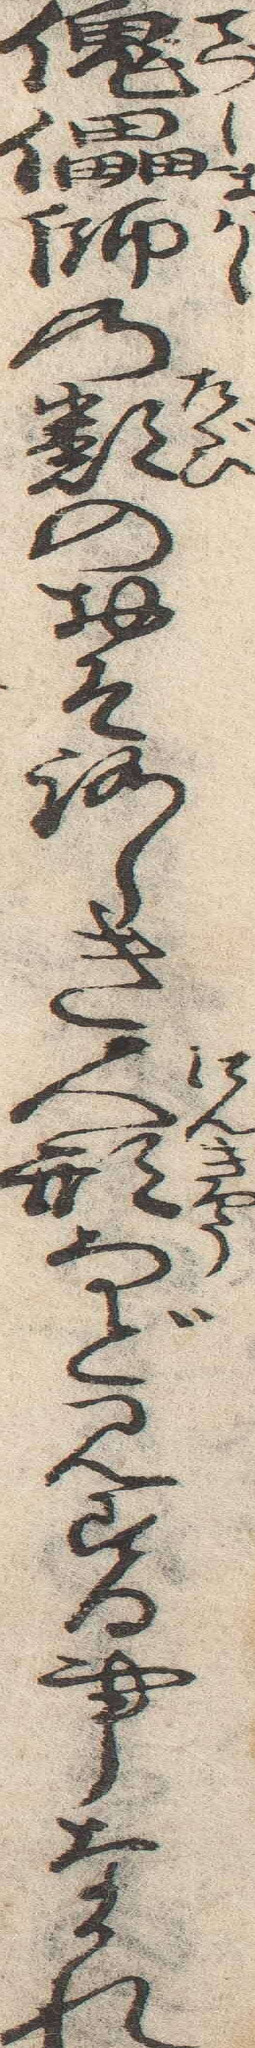傀儡子の類のおそろしき人形など見する事なかれ
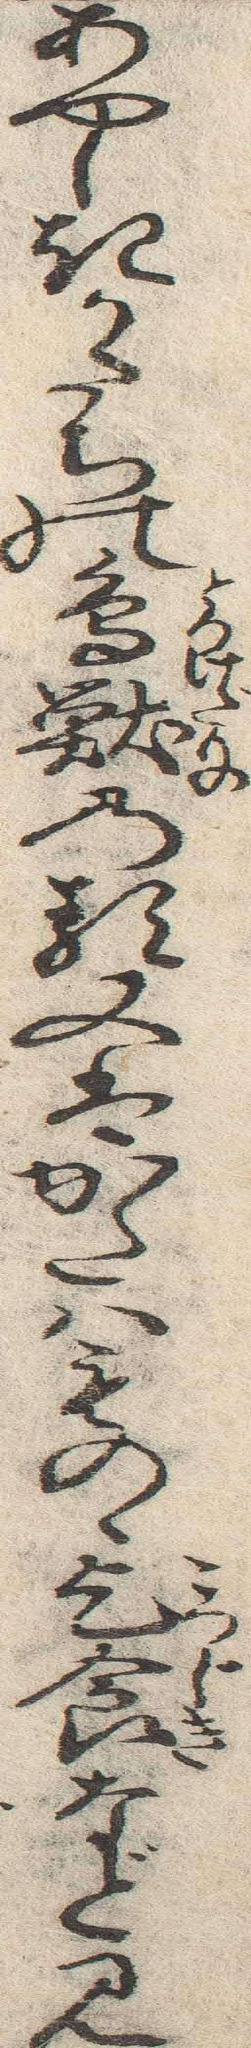あやしきかたちの鳥獣の類又はかたはものゝ乞食など見
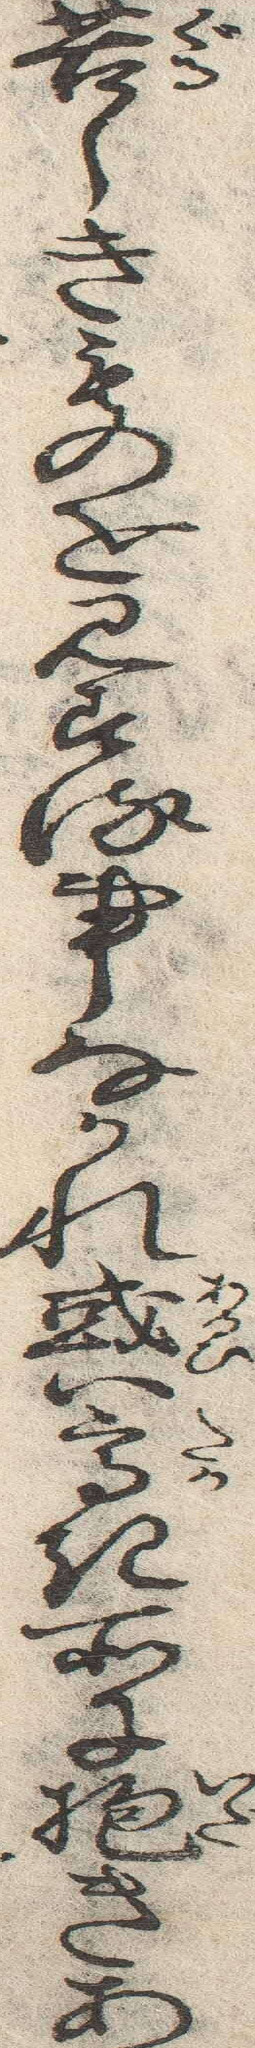苦しきものを見する事なかれ或は高き所に抱きあ
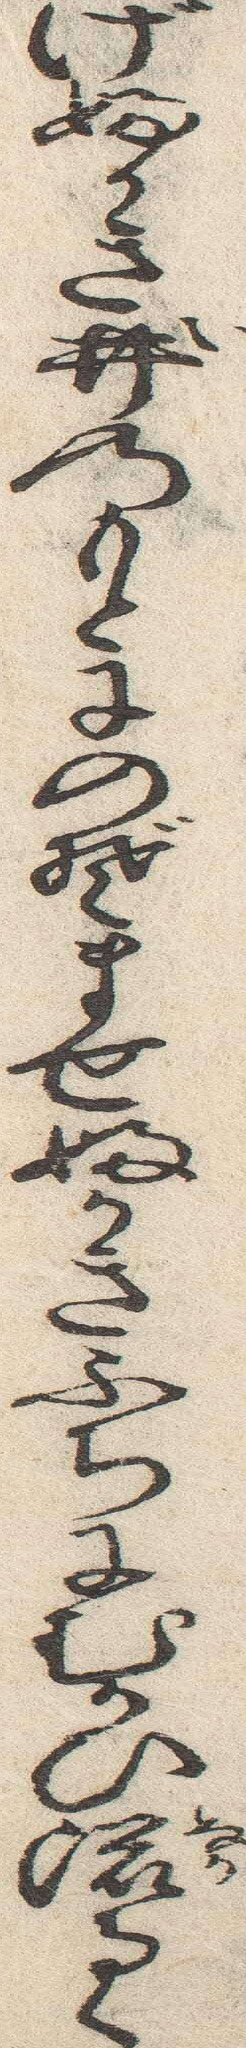げふかき井のもとにのぞませふかきふちにむかひ流るゝ
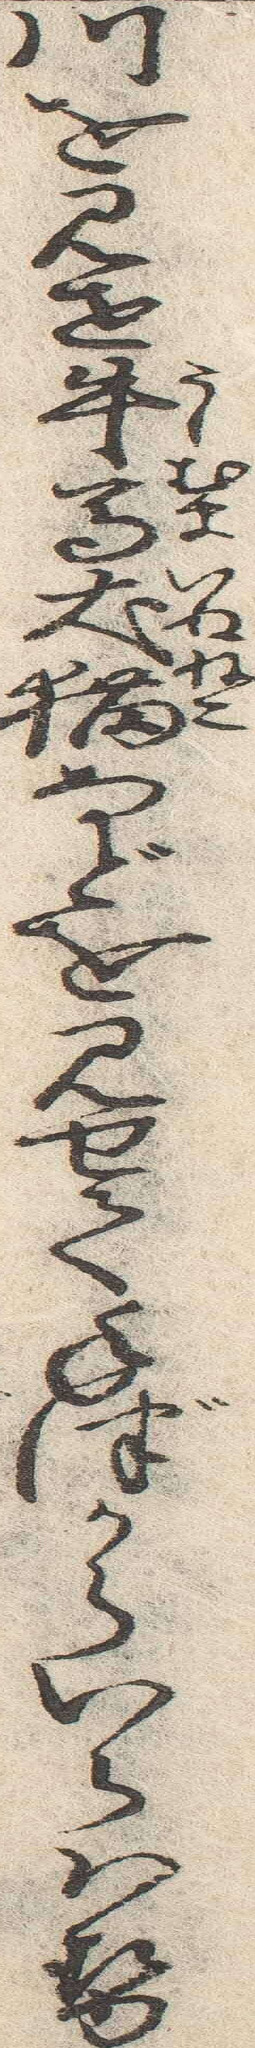川を見せ牛馬犬猫などを見せててづからいらはせ
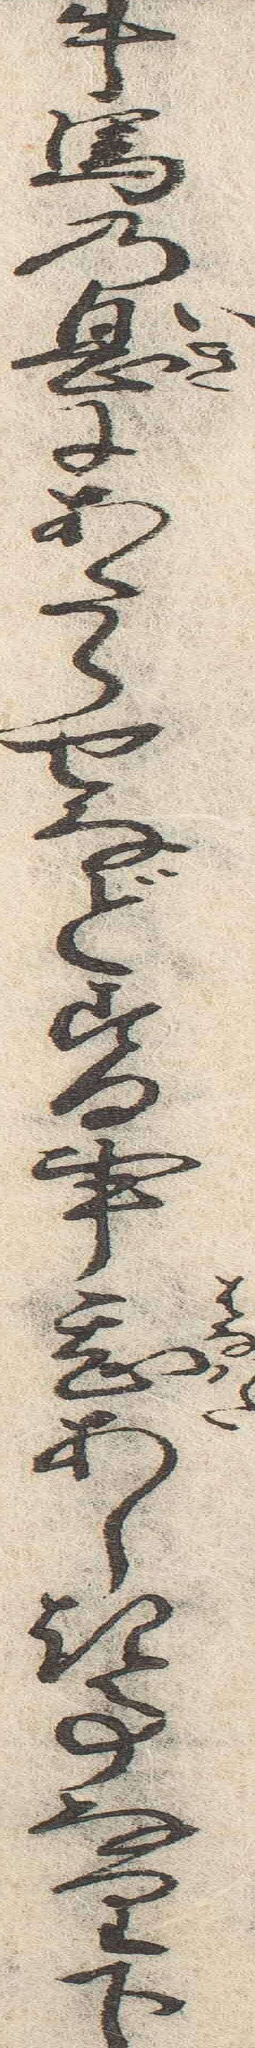牛馬の息にあたらせなどする事甚あしき事なり下
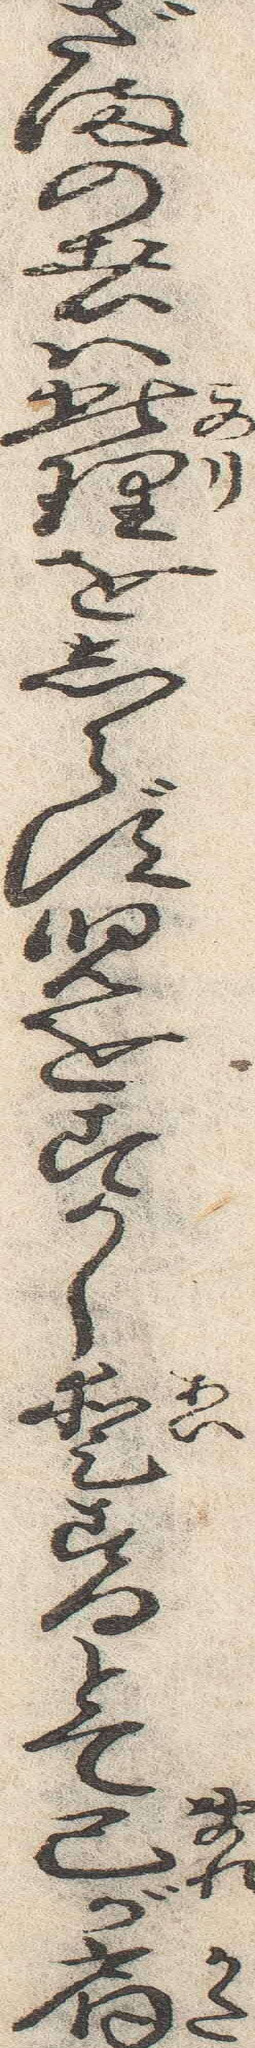ざまの者は此理をしらず児をすかし愛するとて己が肩
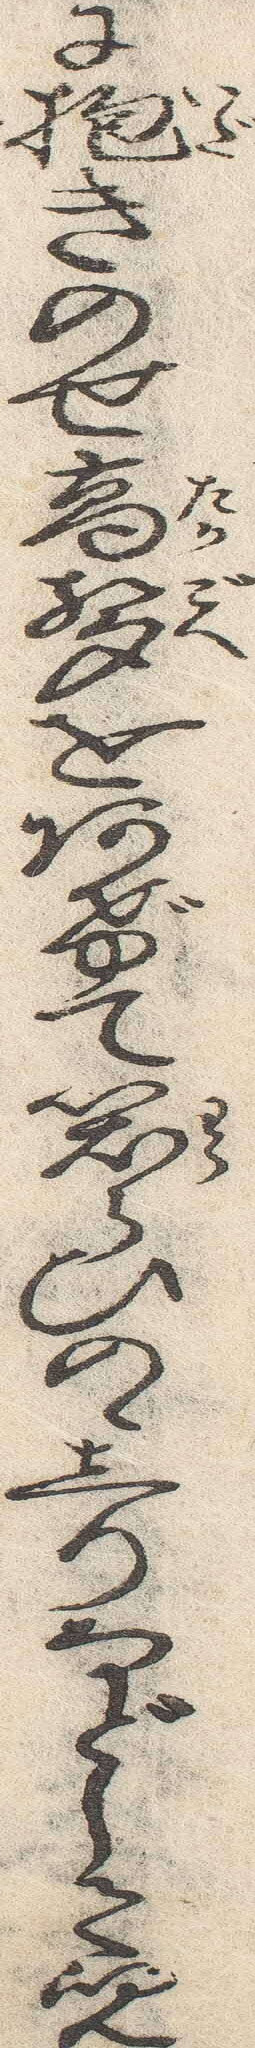に抱きのせ高聲をあげて笑らひのゝしりなどして児
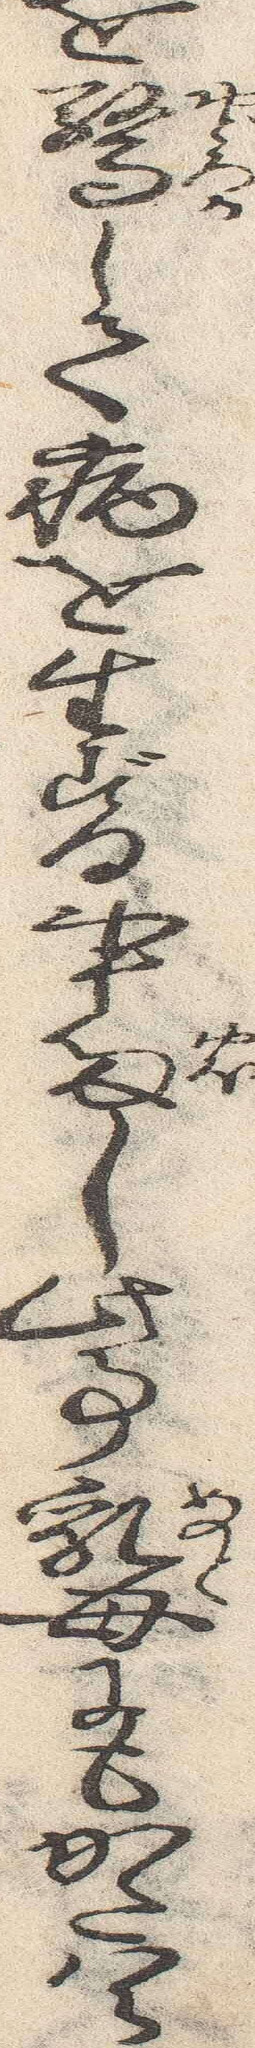を驚して病を生ずる事多し此事乳母にもかたはら
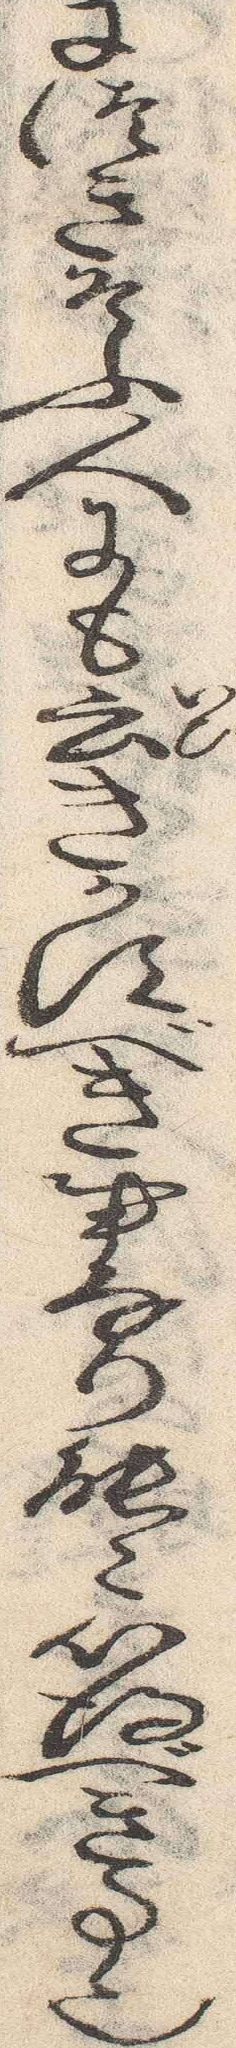につきそふ人にも云きかすべき事なり能〻心得べき事也
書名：小児必用養育草
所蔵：東京学芸大学附属図書館 国文学研究資料館
